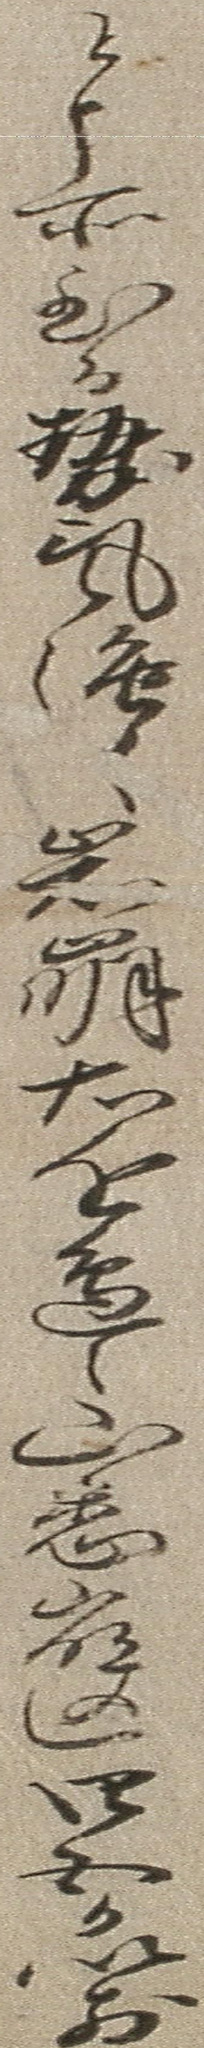と申所至而勢気強く岩崩右近辺之山悉崩込四五日以前
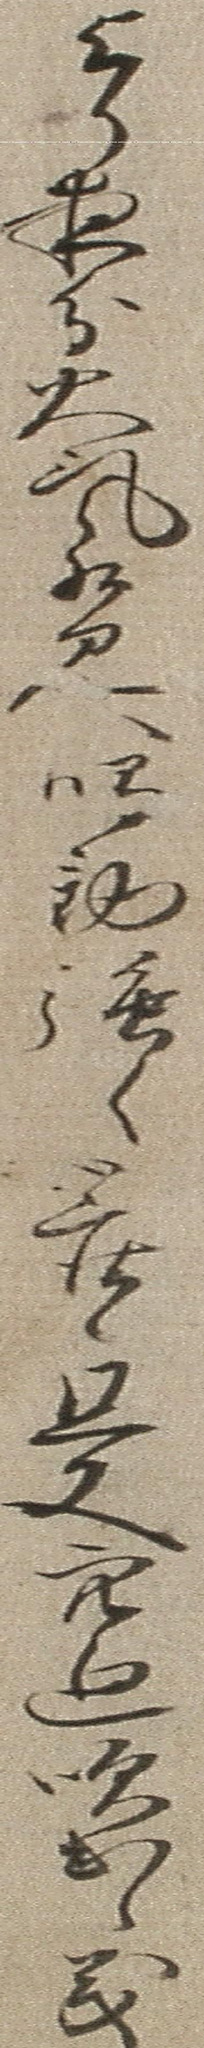より夜分火気相見へ鳴動強く御座候且又穴廻吹出候義
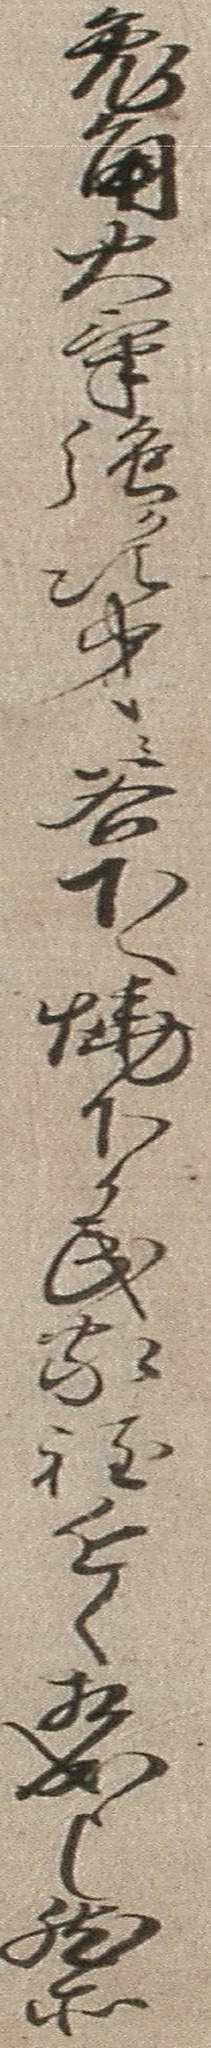兎角火気強く次第ニ谷下へ焼下り民家程近く相成申候然所
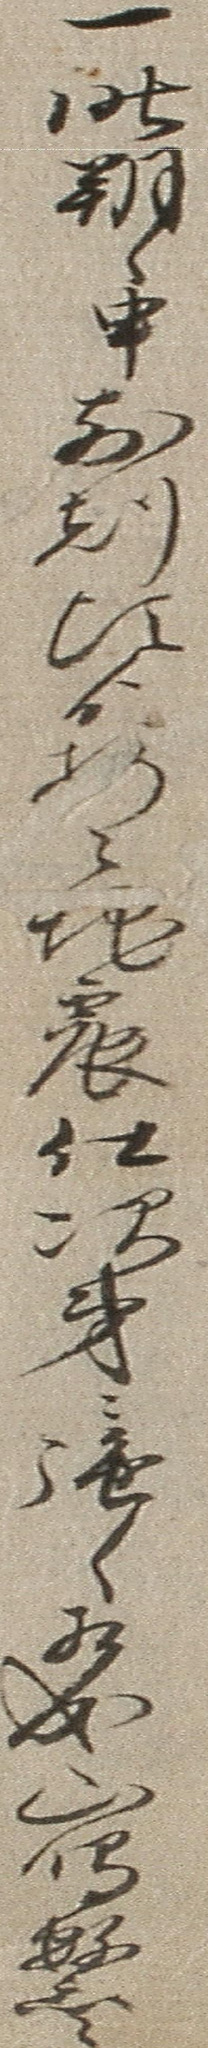一昨朔日申前刻頃ゟ折々地震仕次第ニ強く相成山鳴繁々
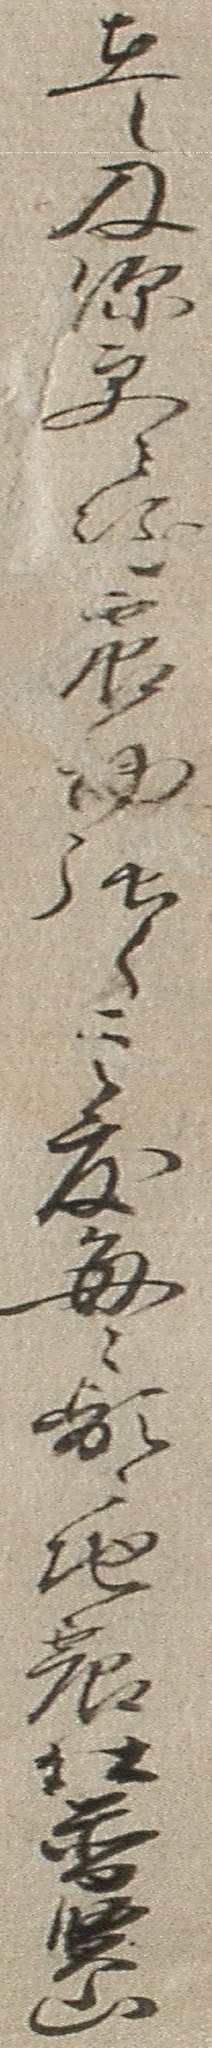在之及深更ニ致震動強く其度毎に頻ニ地震仕普賢山
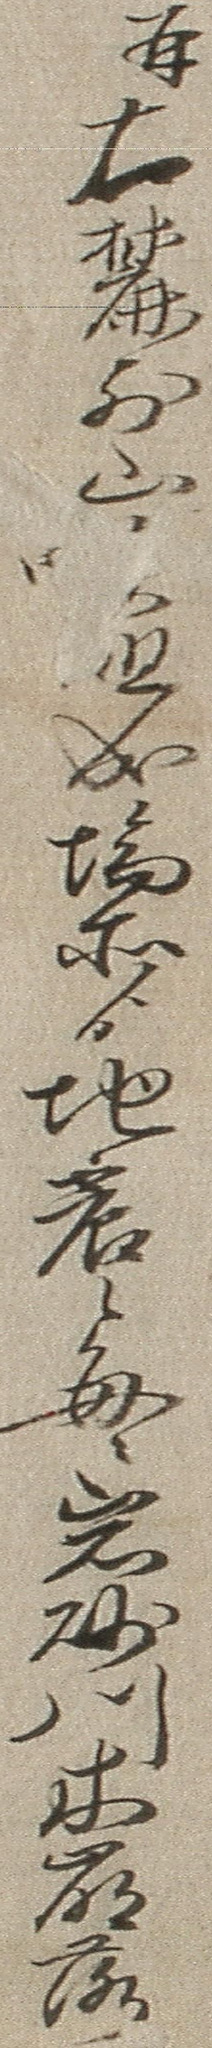并右麓前山嶮岨成場所ゟ地震之毎ニ岩砂川木崩落
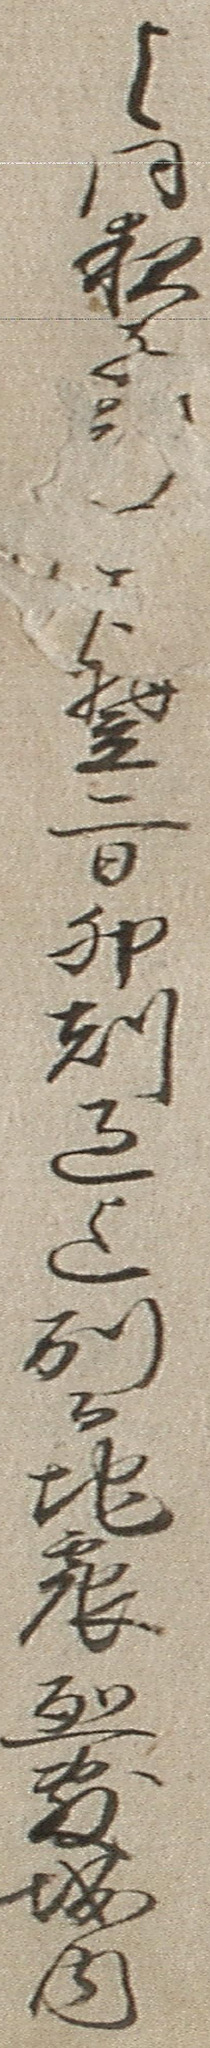申候同夜ゟ翌二日卯刻過迄別而地震烈敷城内
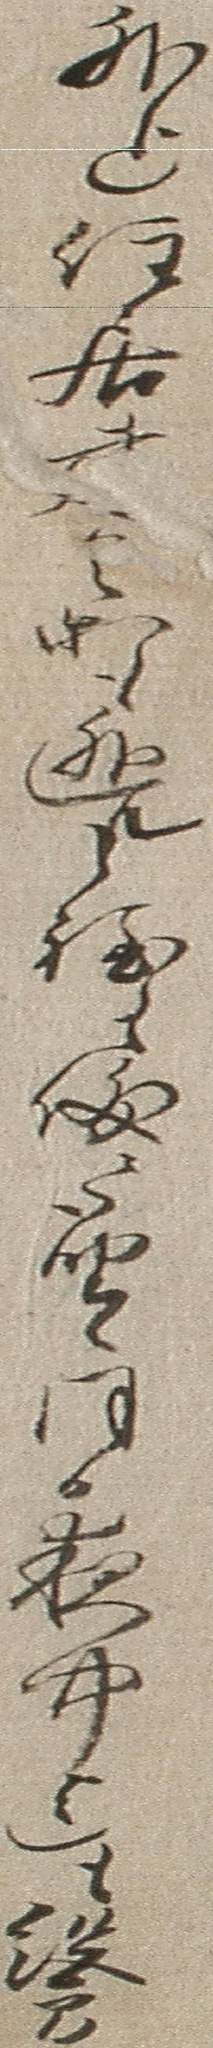外迄住居建具等も逃ル程之儀ニ御座候同日夜中迄も絶間
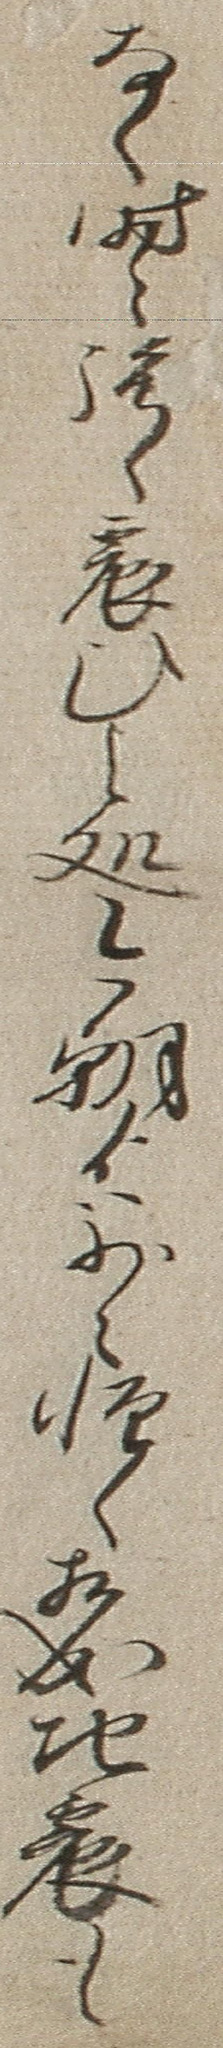なく時々強く震ひ申候処今朝ゟは少々軽く相成地震も
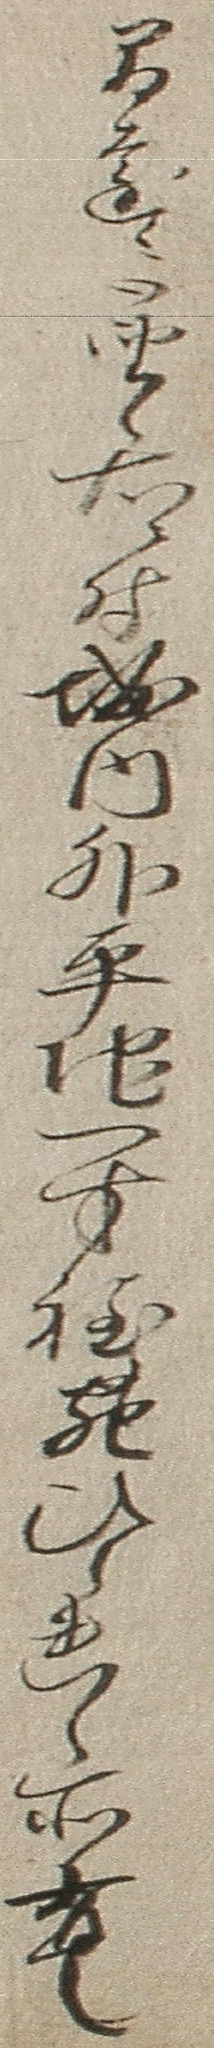間遠ニ御座候右ニ付城内外平地一寸程宛ひしれ候所有之

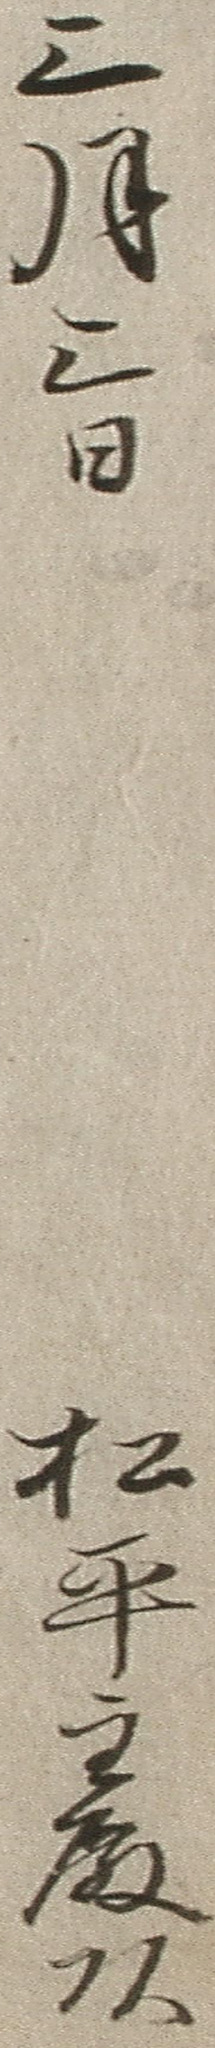三月三日松平主殿頭
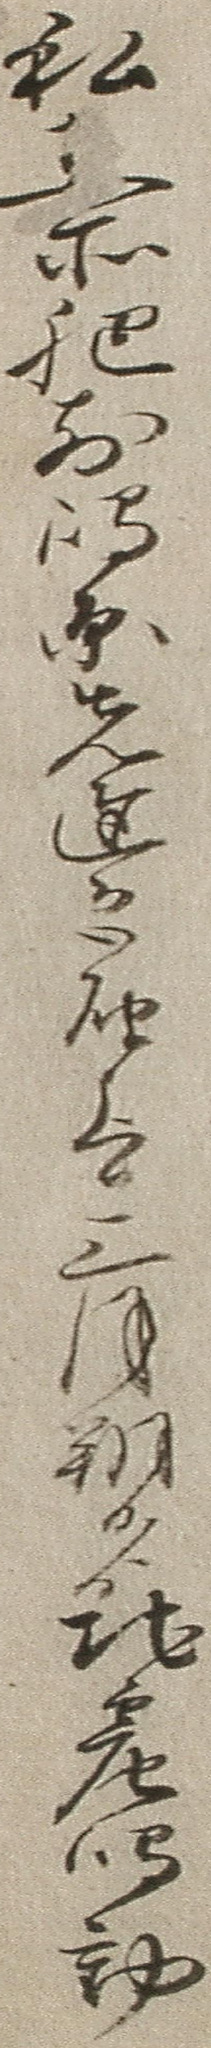私在所肥前嶋原先達而御届申上候三月朔日ゟ地震鳴動
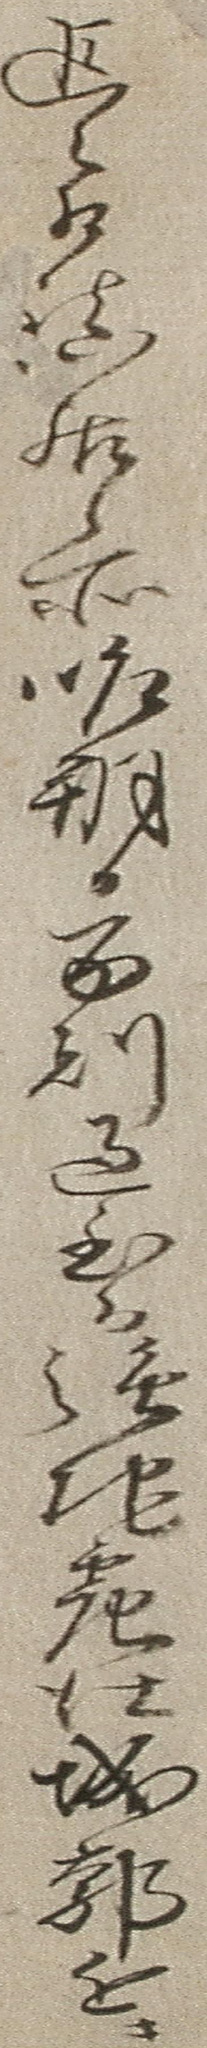追々相鎮居候所昨朔日酉刻過至而強地震仕城郭近き
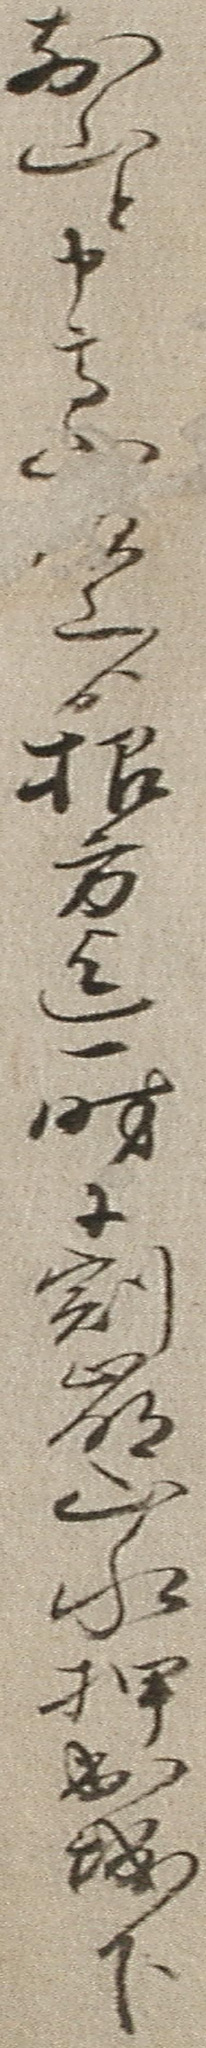前山と申高山頂上ゟ根方迄一時に割崩山水押出城下
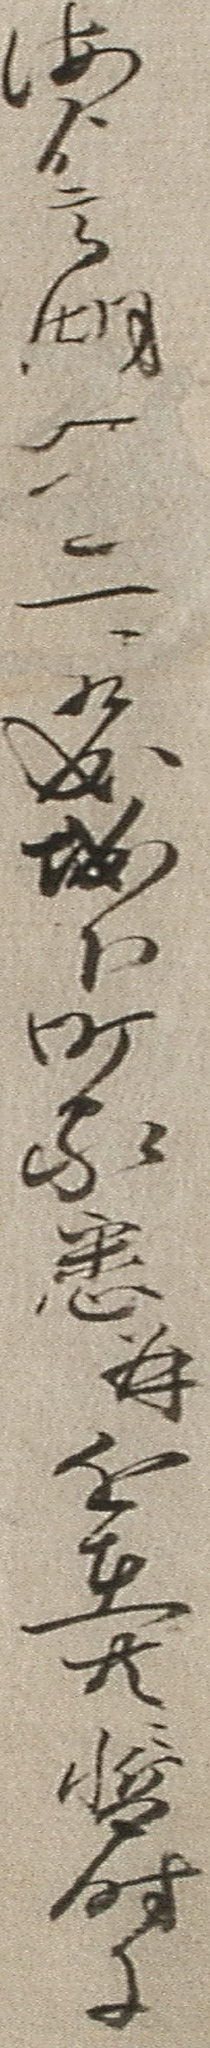海ゟ高潮打上可相成城下町家悉并近在共に暫時に
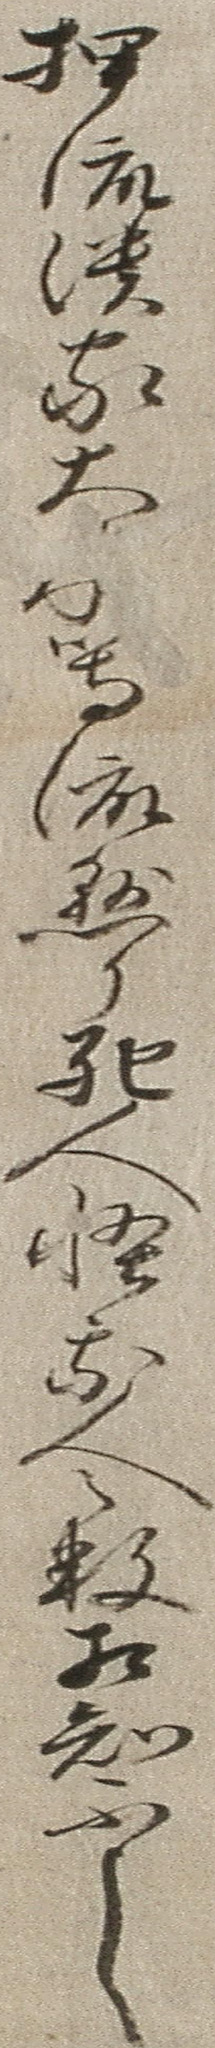押流潰家大等流懸り死人怪我人之数相知不申候
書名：太平秘録抜書　浅間山燒及普賢山崩
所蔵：東京大学地震研究所図書室 Earthquake Research Institute Library, The University of Tokyo, JAPAN
